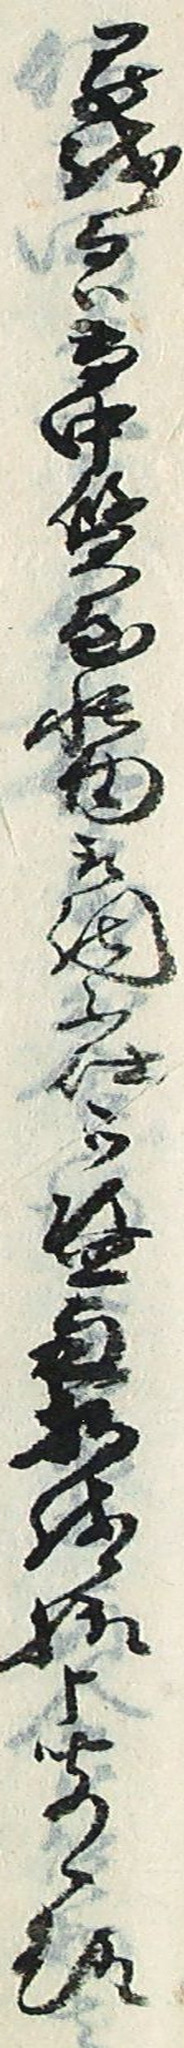罷越候而ハ市中質屋帳面取調不仕被盗主指越候様申聞候趣
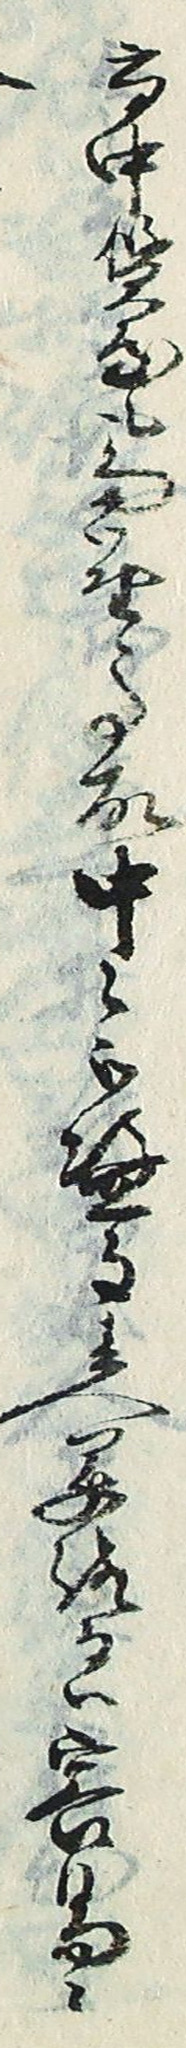市中質屋も多御坐候事故中々被盗主壱人罷越候而ハ容易ニ
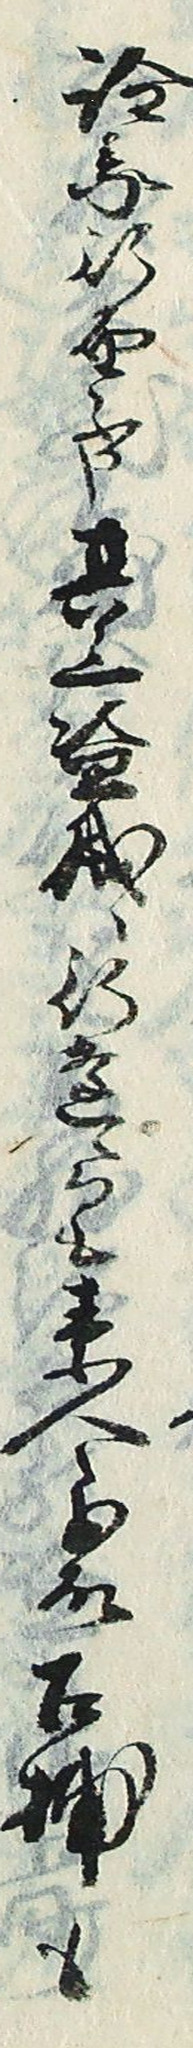詮義行届不申其上盗賊ニ行逢候而も素人之義故召捕も
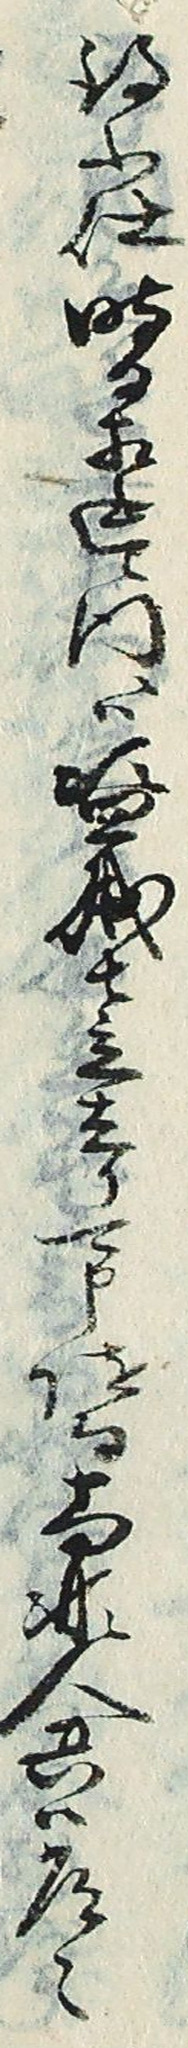得不仕時日相延候内ニハ盗賊者立去り可申随而番非人共ハ常々
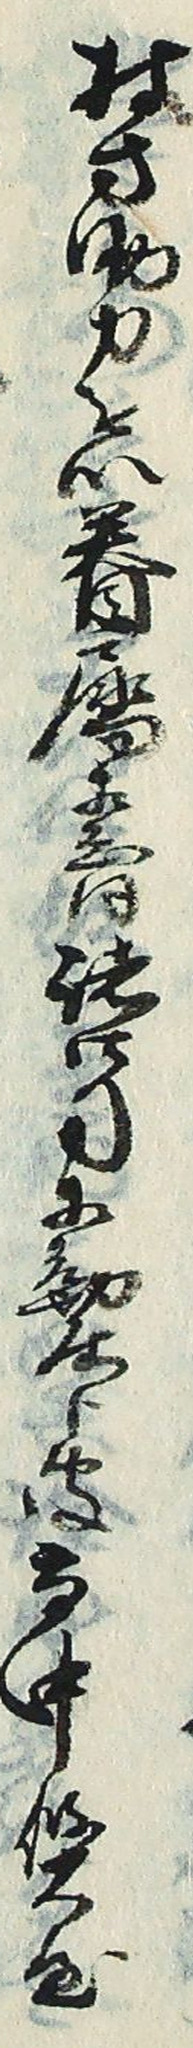村方助力を以眷属相育諸御用相勤居申處市中質屋
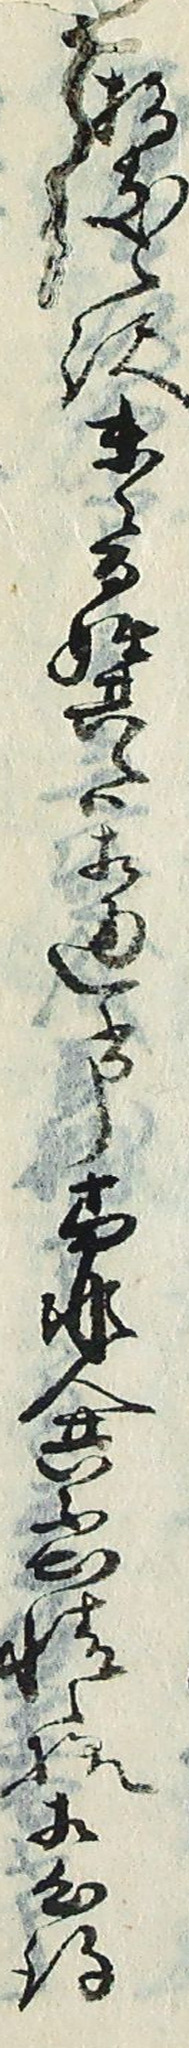指支候訳末々百姓共候へハ相通不申番非人共不出精候様相心得
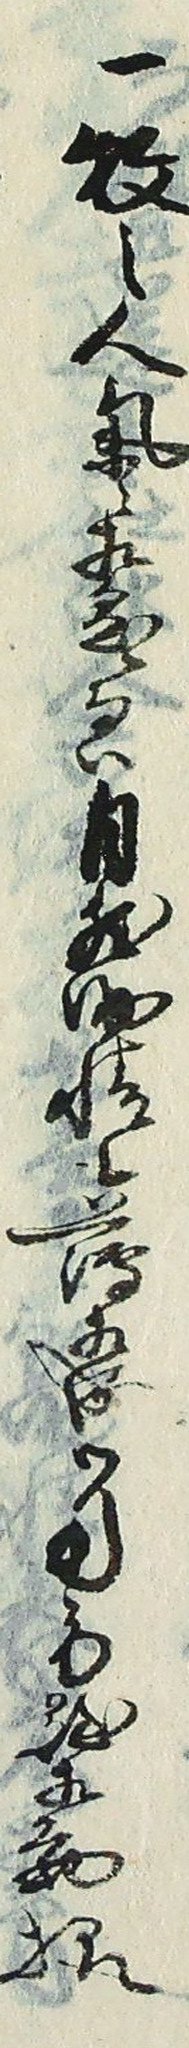一牧之人氣ニ相懸候而ハ自然助情も薄相成御用方難相勤様
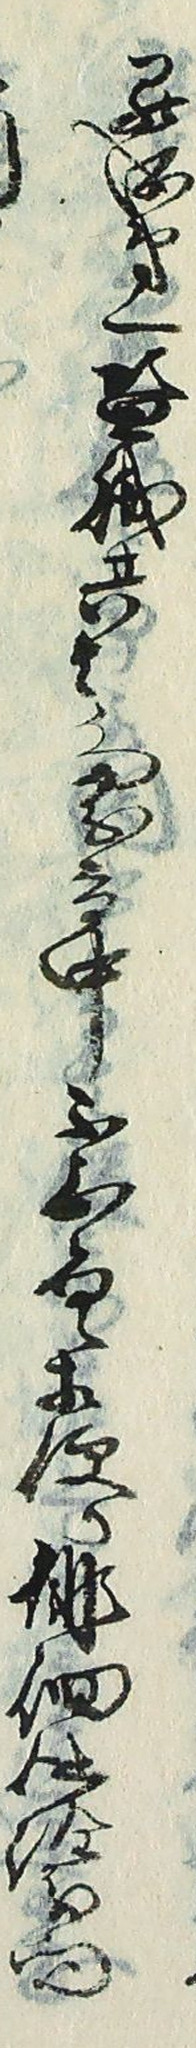罷成第一盗賊共者多分市中不正者ニ相便り徘徊仕詮義向
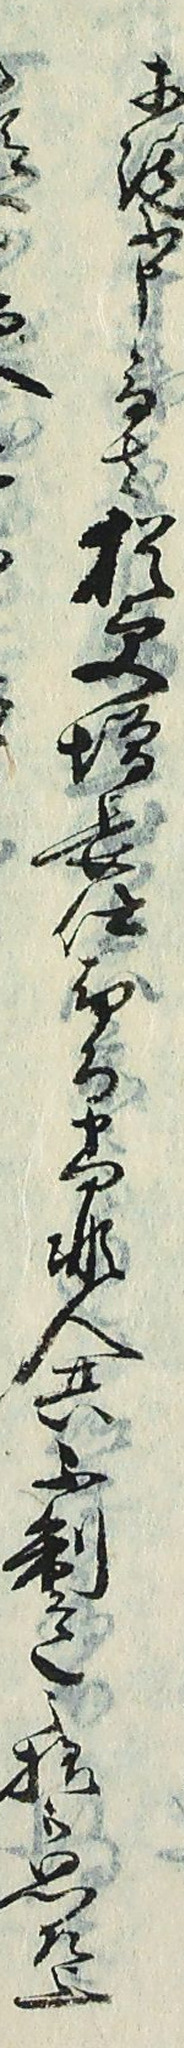相調不申候而者猶更増長仕却而番非人共不制道之様被思召上
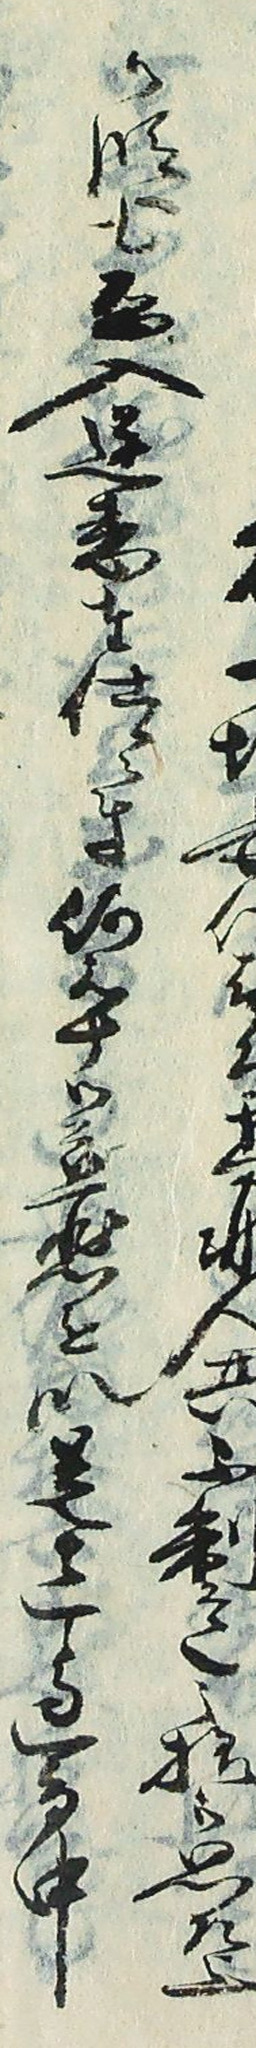候段も恐入迷惑奉仕候ニ付何卒御慈悲を以是迄之通市中
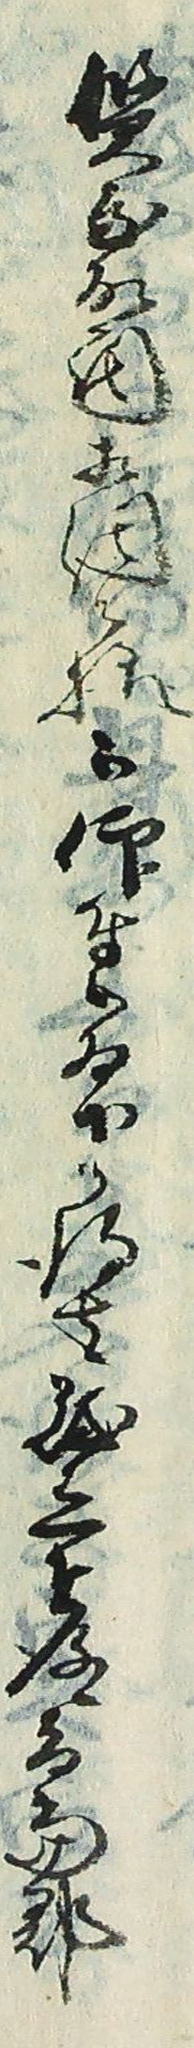質屋取調相調候様被仰付被為下候得者難有奉存候旨當郡
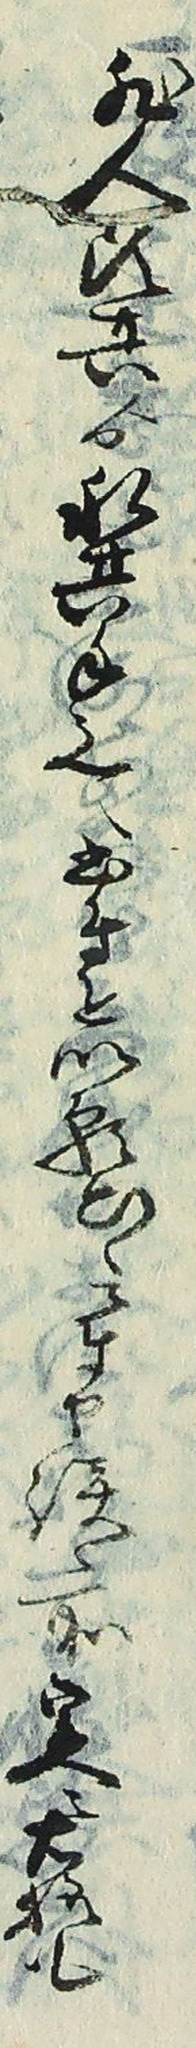非人頭共ゟ私共手元へ書付を以願出候ニ付申談候所実ニ右様も
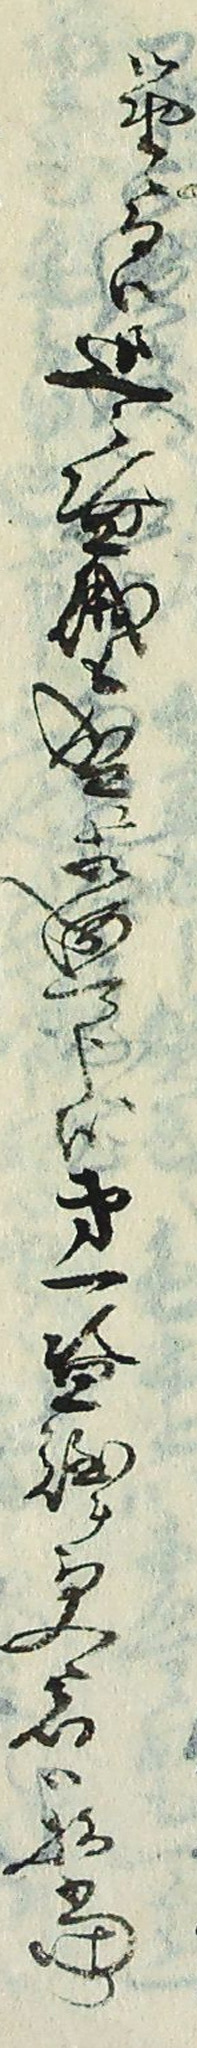御坐候而ハ追々盗賊も盛ニ相成可申哉第一盗難ヲ受候者ハ指當り
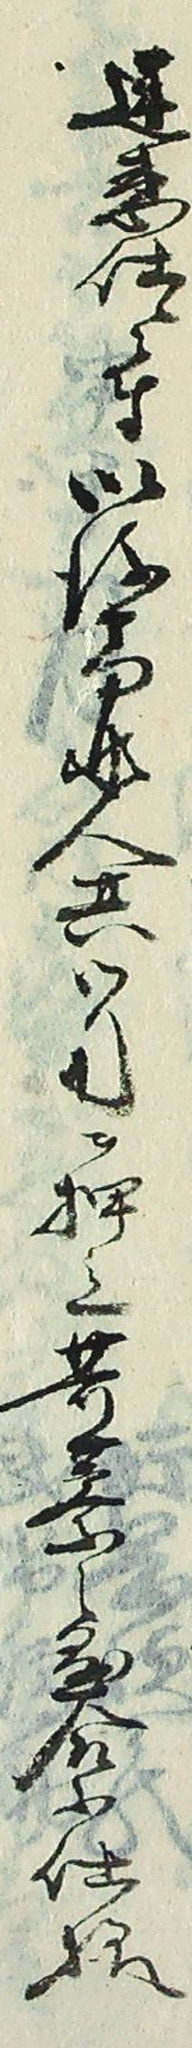迷惑仕候ニ付以後番非人共御用ヲ押立苛察之懸合不仕様
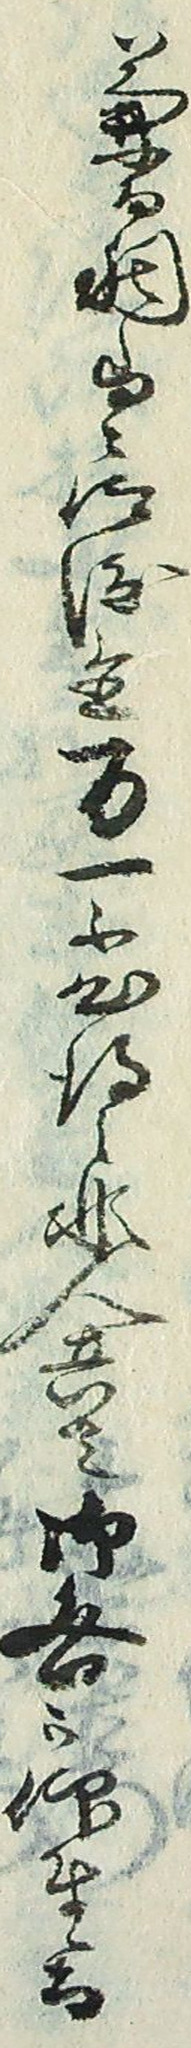兼而稠布被仰渡置万一不心得之非人共者御咎被仰付候旨
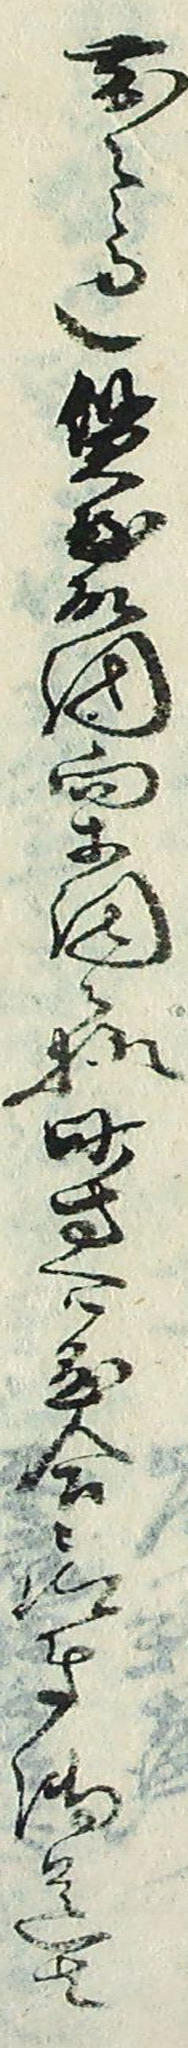前々之通質屋取調向相調候様町方へ御懸合被仰付御達者
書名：市郷質屋株御取究並御書出御趣法之写
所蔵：鳴門教育大学 Naruto University of Education
